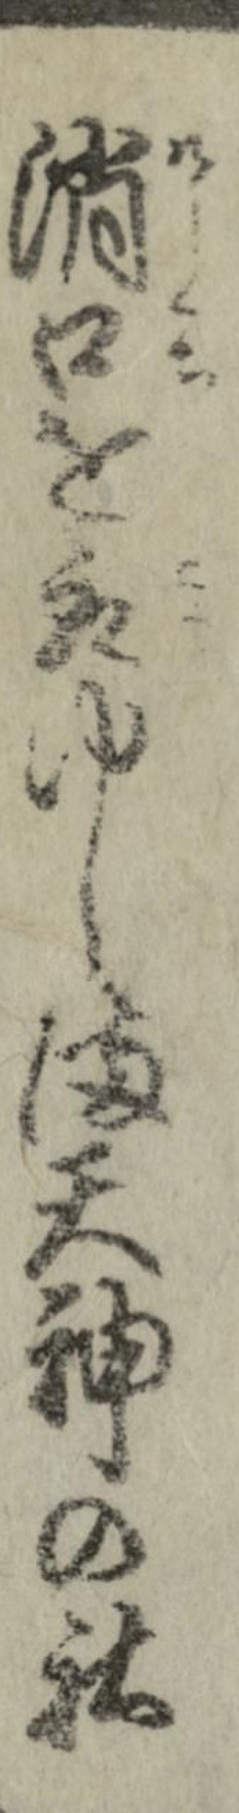消口を取ゆしま天神の社
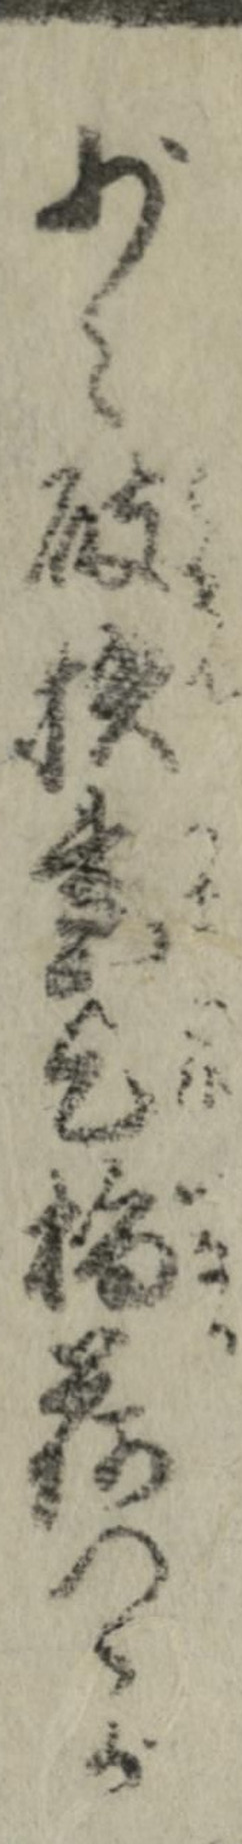少々破損妻乞稲荷つゝが
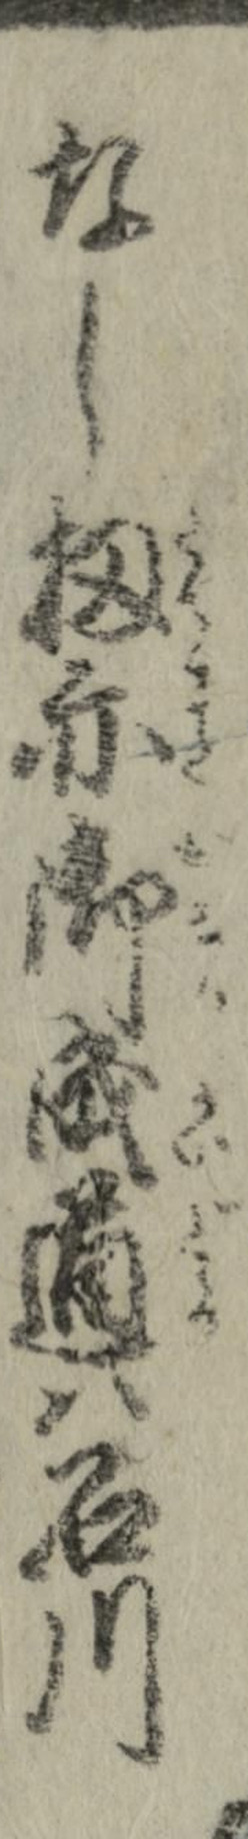なし扨亦御成道は石川
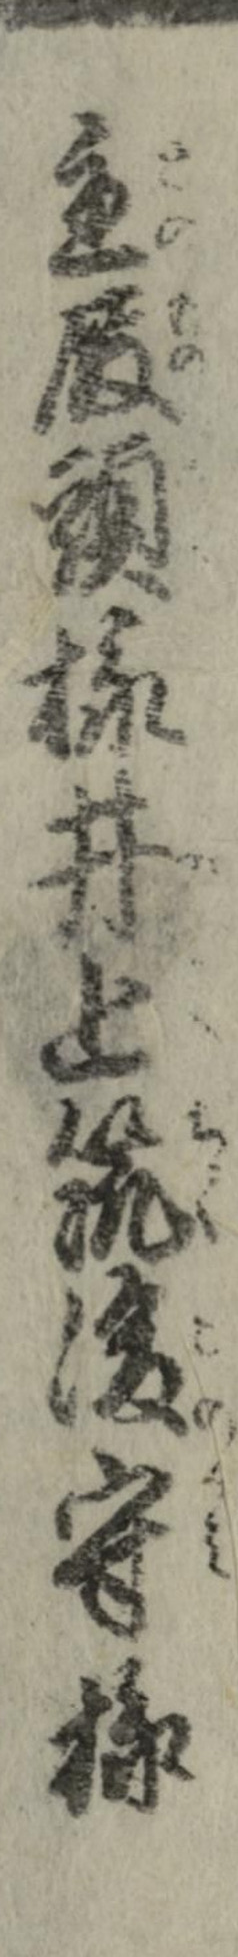主殿頭様井上筑後守様
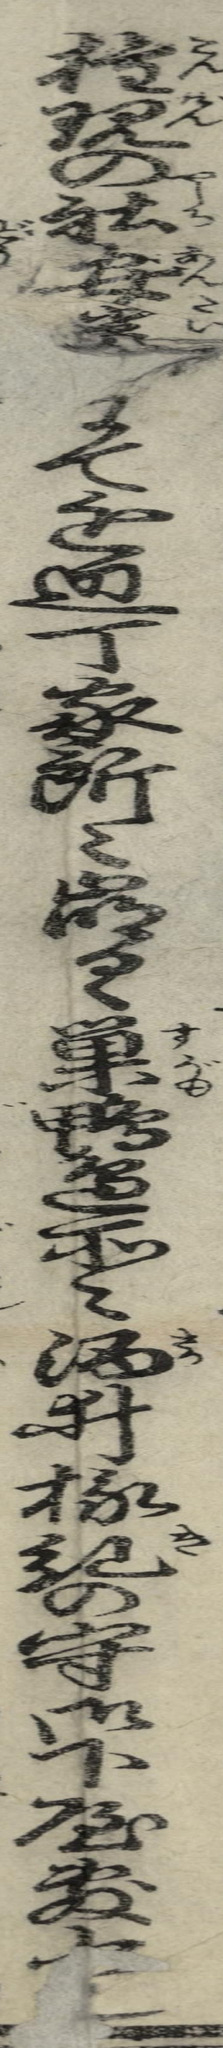権現の社安泰にて近辺丁家所々崩る巣鴨辺所々酒井様紀の守御下屋敷少し
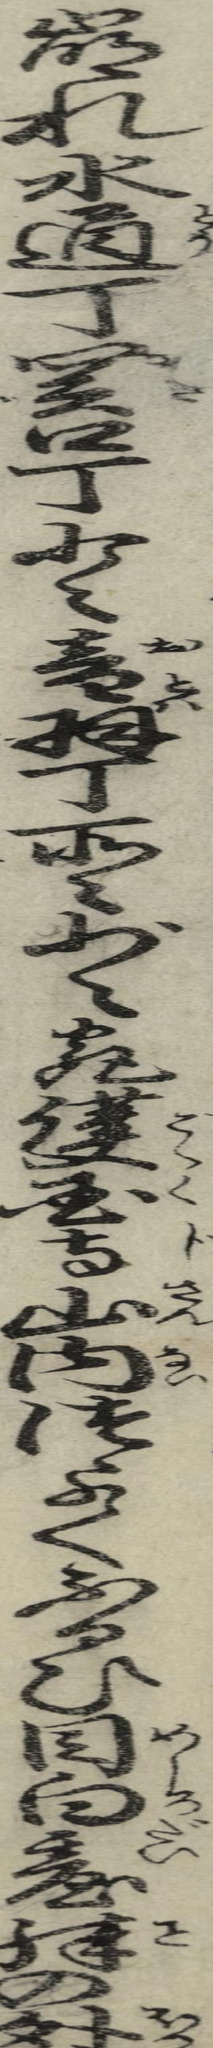崩れ水道丁関口丁少々音羽丁所々少々宛護国寺山内つよくふるひ目白台殊の外
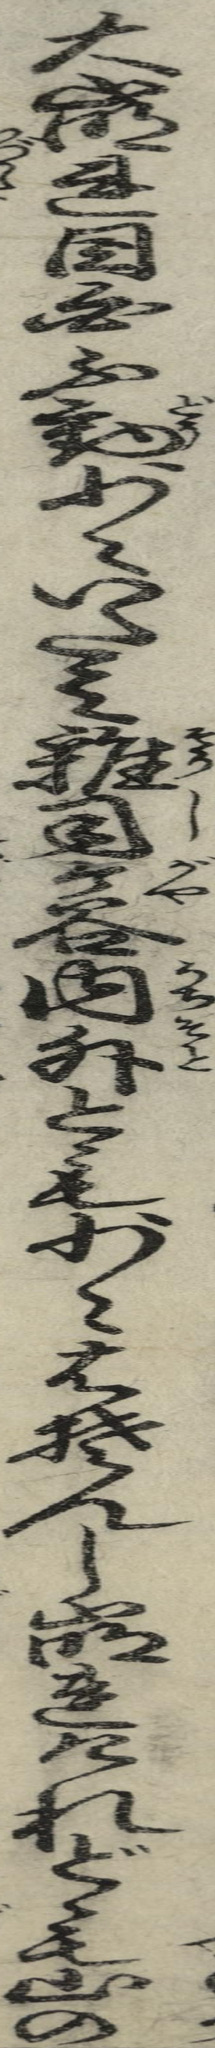大崩れ目白不動少々いたみ雑司ケ谷がや内外とも少々はそんし崩れけれども山の
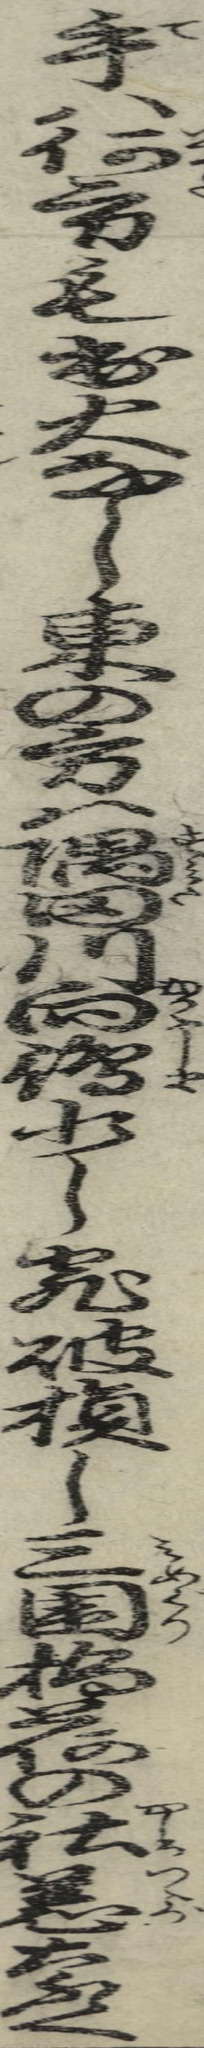手は何方も出火なし東の方は隅田川向嶋少し宛破損し三囲稲荷の社恙なく
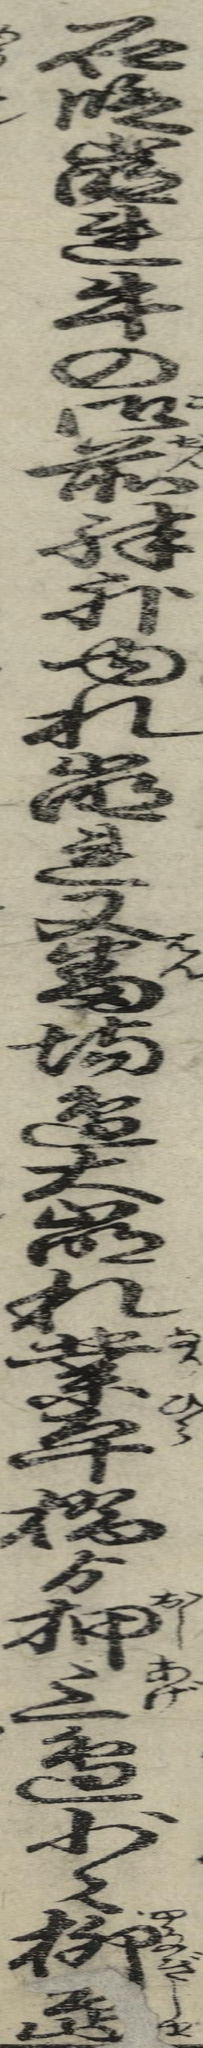石段崩れ牛の御前殊外ゆれ崩れ又番場辺大崩れ業平橋ゟ押上辺少々柳島
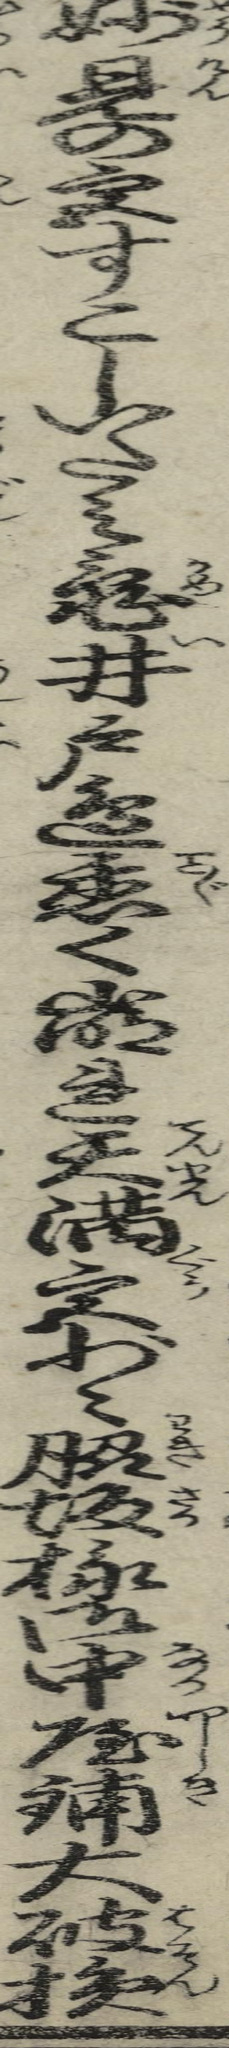妙見の宮すこしいたみ亀井戸辺悉く崩れ天満宮少々脇坂様御中屋鋪大破損
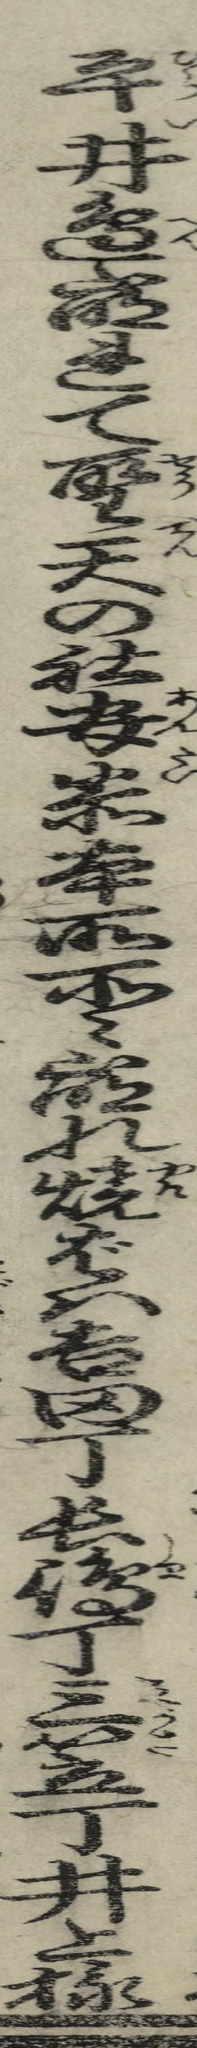平井辺崩れて聖天の社安泰本所所々崩れ焼ばは吉田丁長嶋丁三笠丁井上様
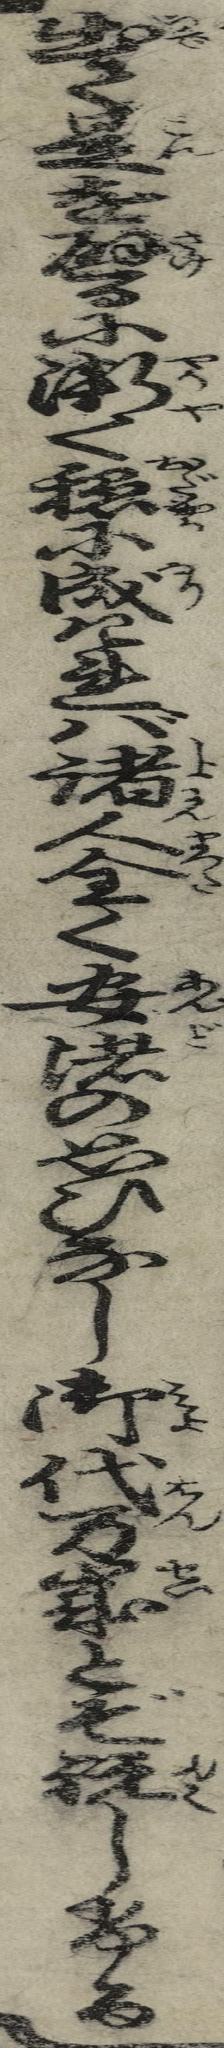出て是を避るに漸く穏に成ければ諸人全く安堵の思ひなし御代万歳とぞ祝しける
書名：ゆるがぬ御代要之石寿榮
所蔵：東京大学地震研究所図書室 Earthquake Research Institute Library, The University of Tokyo, JAPAN
